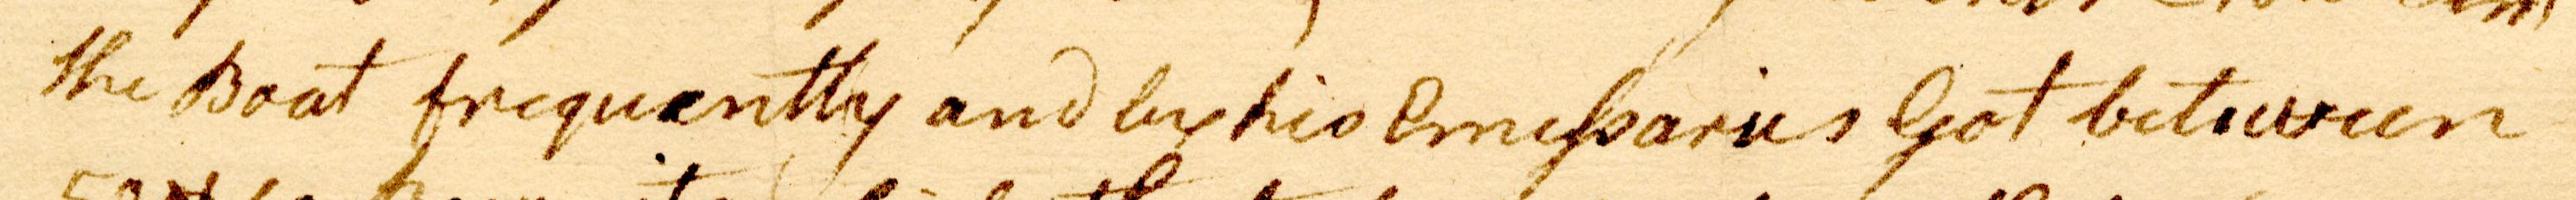the Boat frequently and by his emissaries Got between
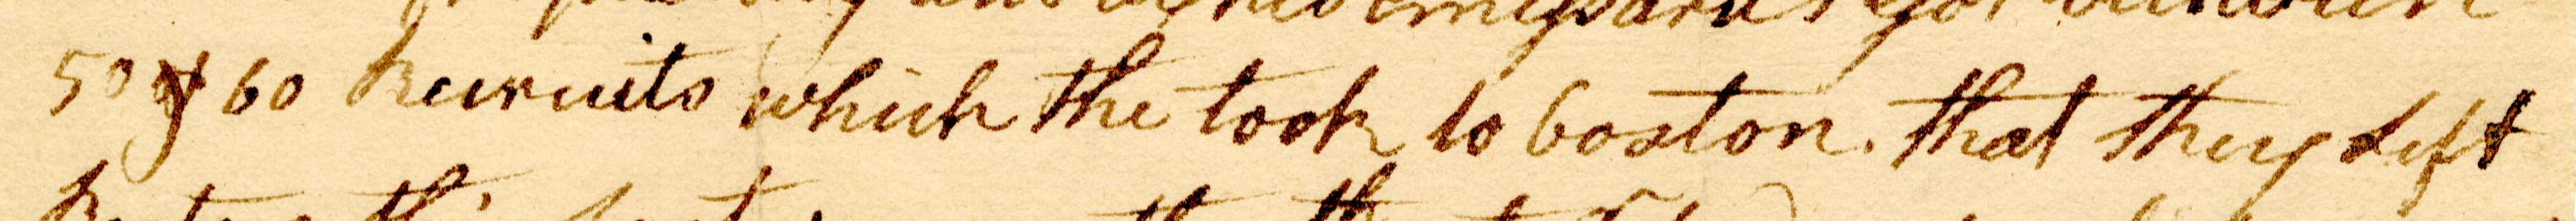50 & 60 Recruits which the took to boston that they left
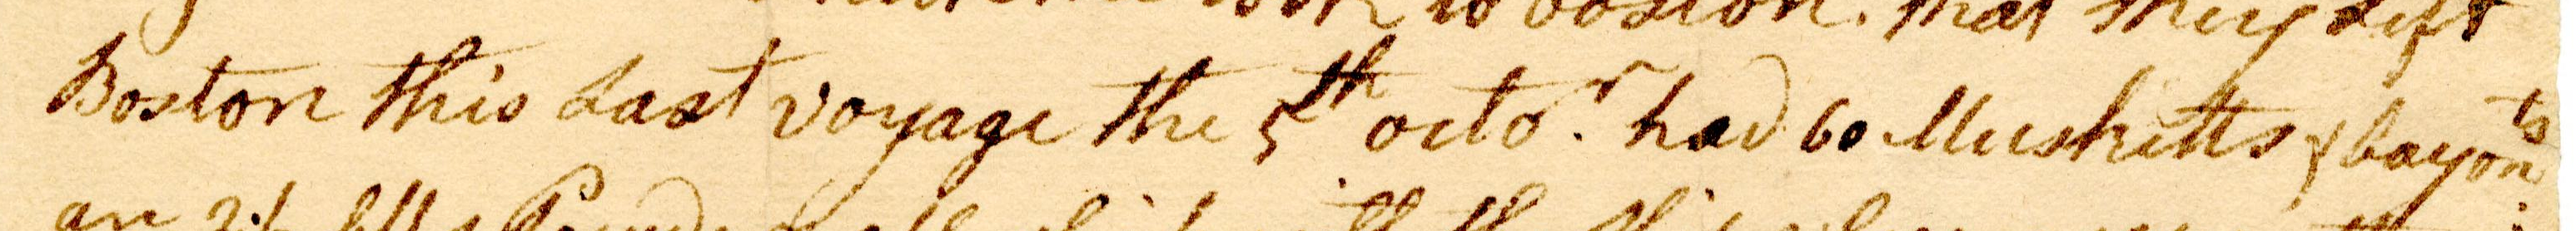Boston this Last voyage the 5^th octo^r. had 60 Massachusetts bayon^ts:
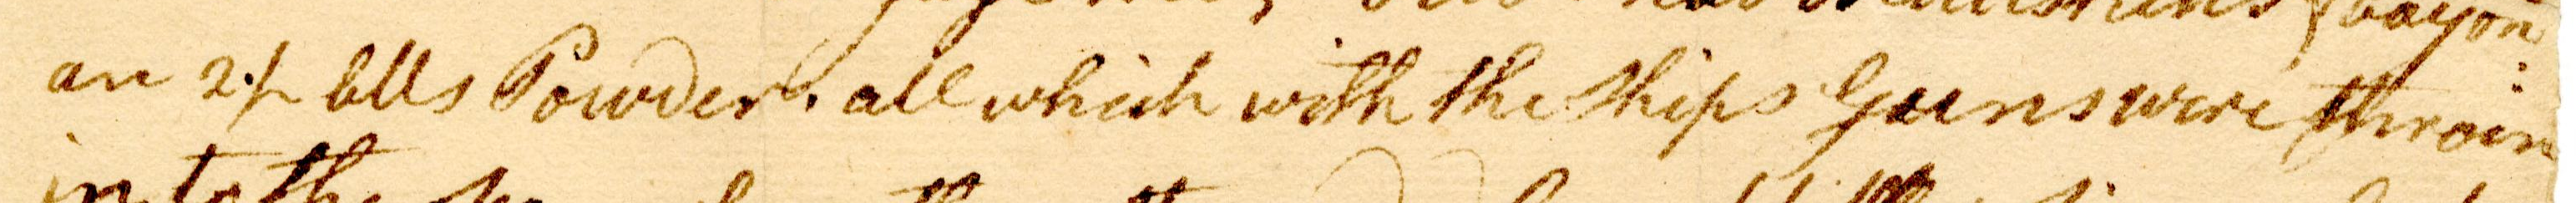an 21 blls Powder all which with the ships Guns were thrown
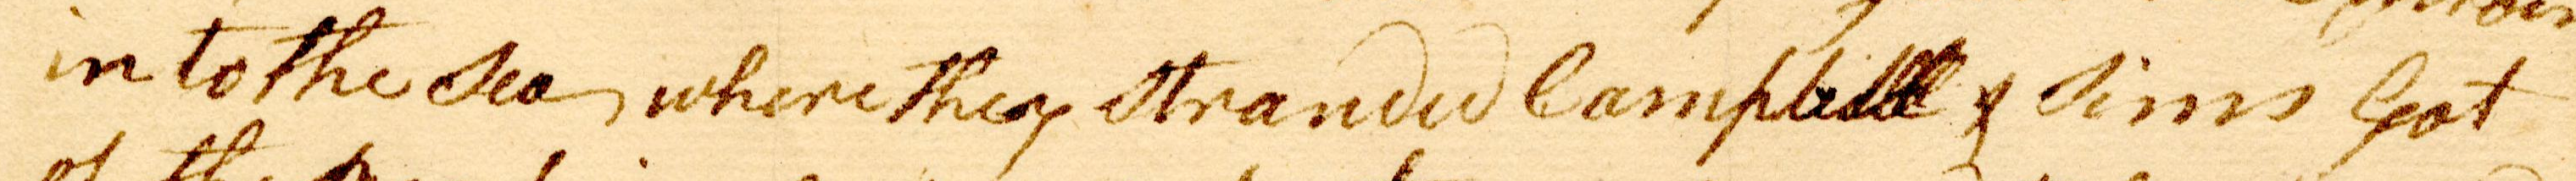in to the sea where they stranded Campbell & Sims Got
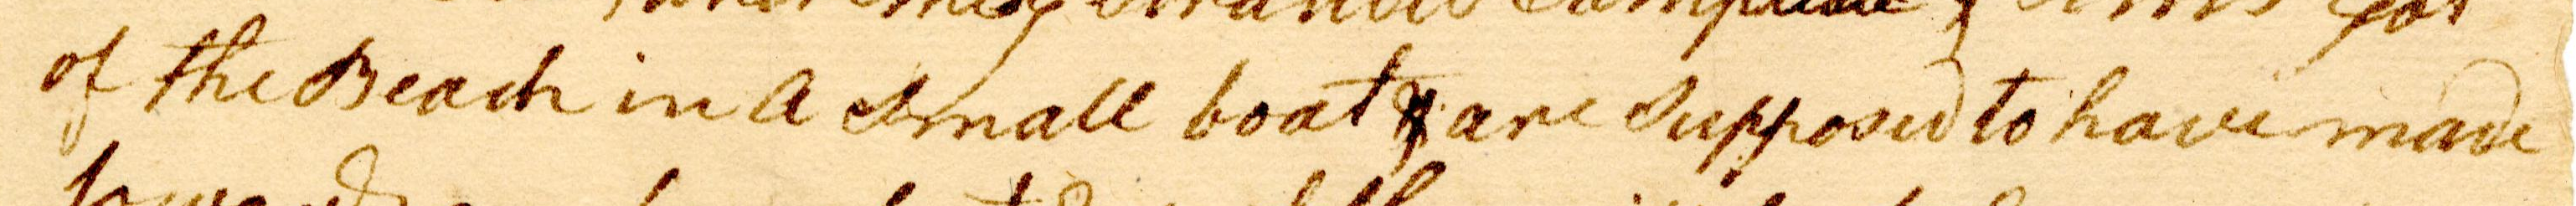of the Beach in a small boat & are supposed to have made
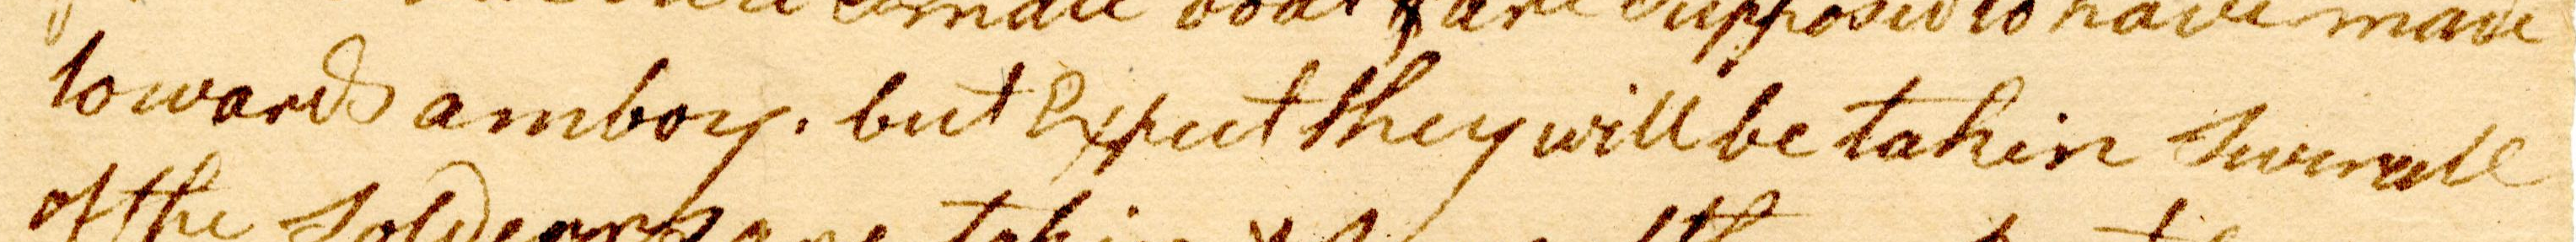toward amboy but Expect they will be takin Severall
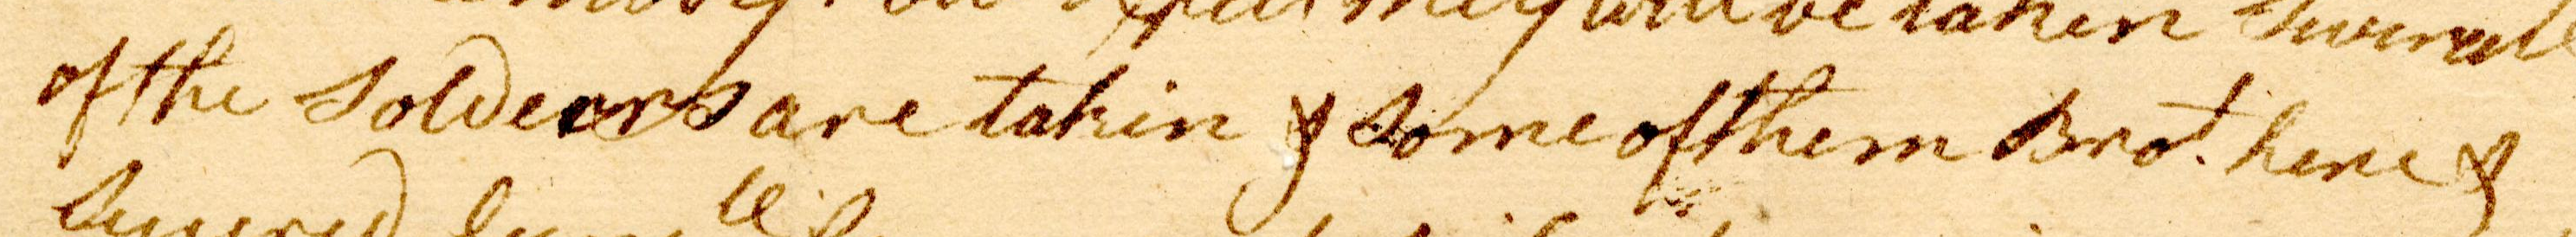of the Soldiers are takin & some of them Bro^t. here &
